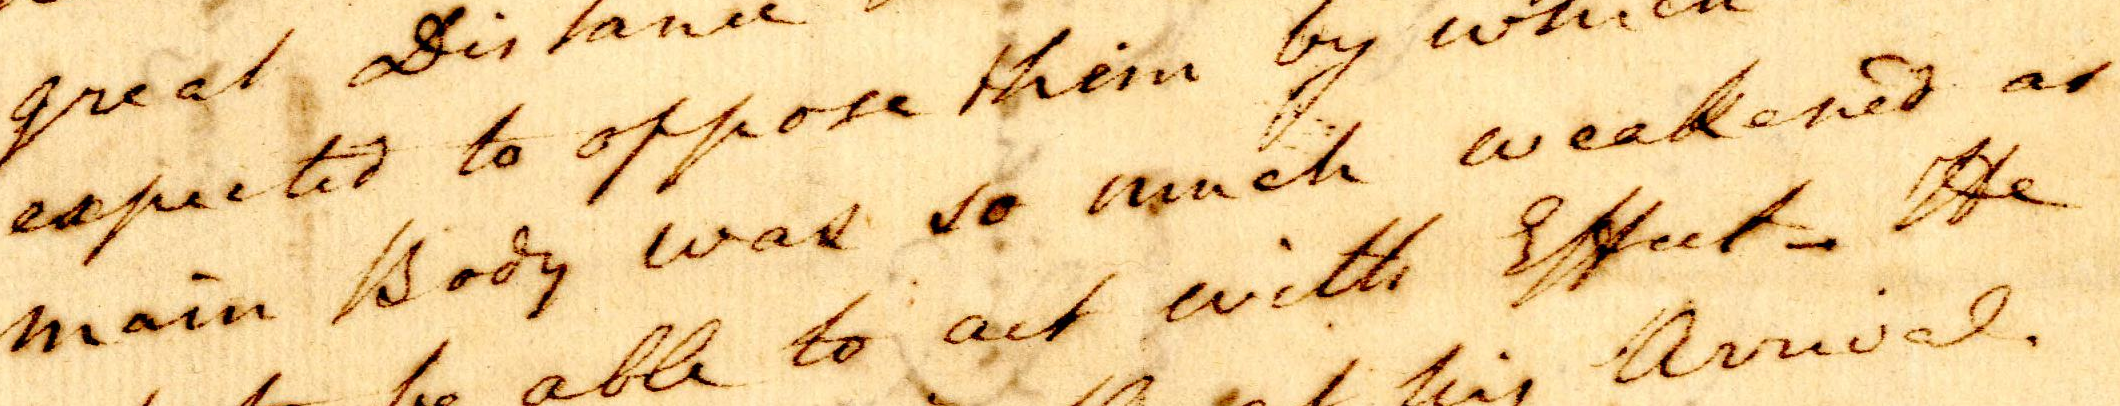main Body was so much weakened as
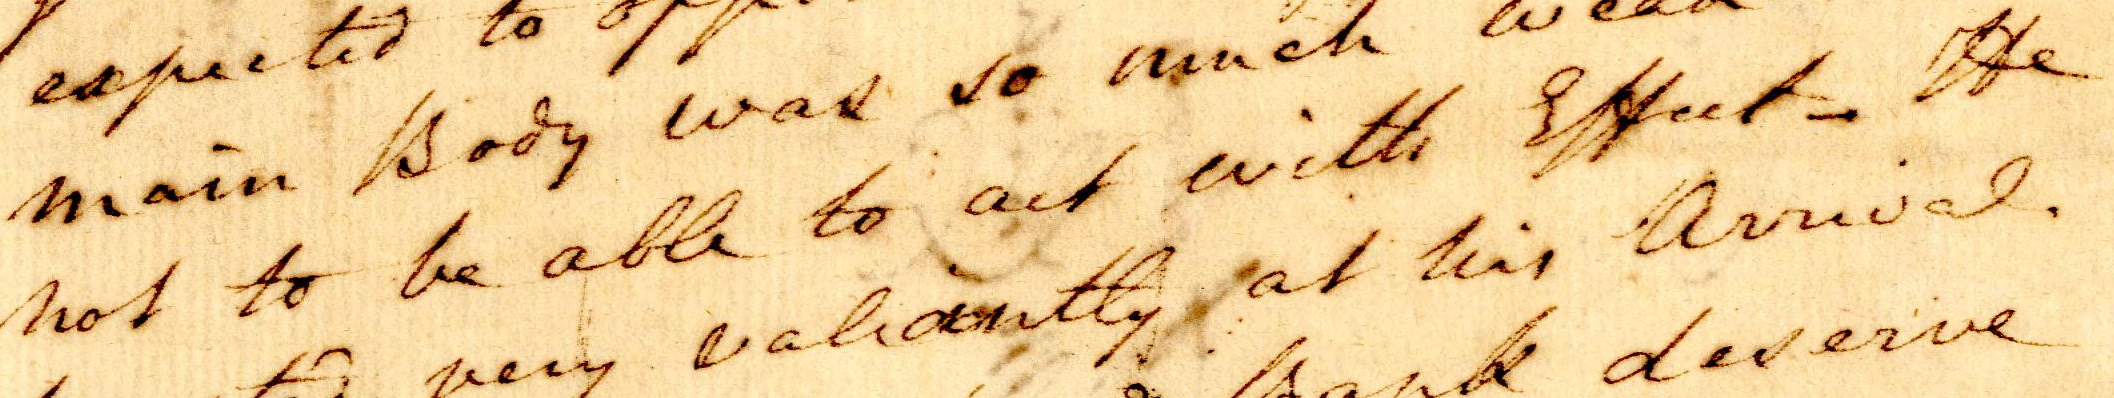not to be able to act with Effect- He
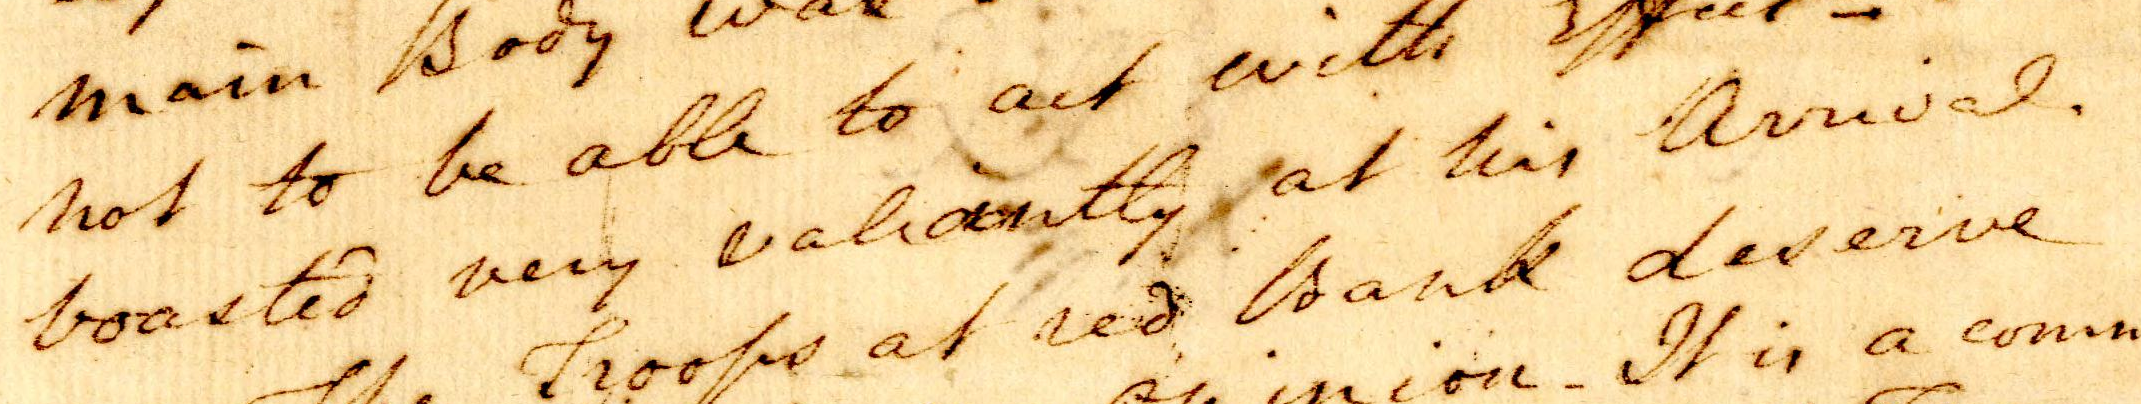boasted very valiantly at his Arrival.
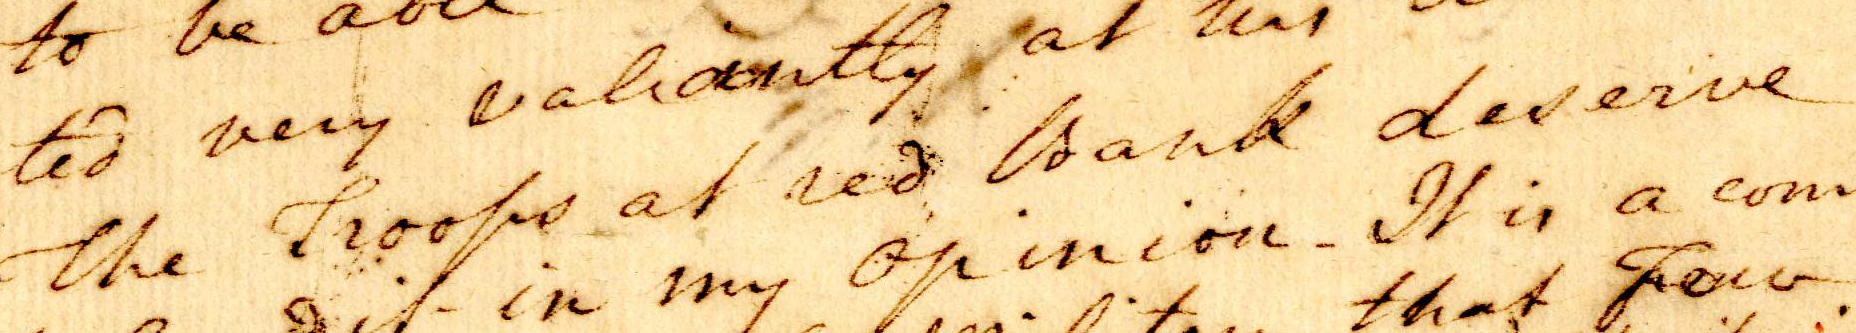The Troops at red Bank deserve
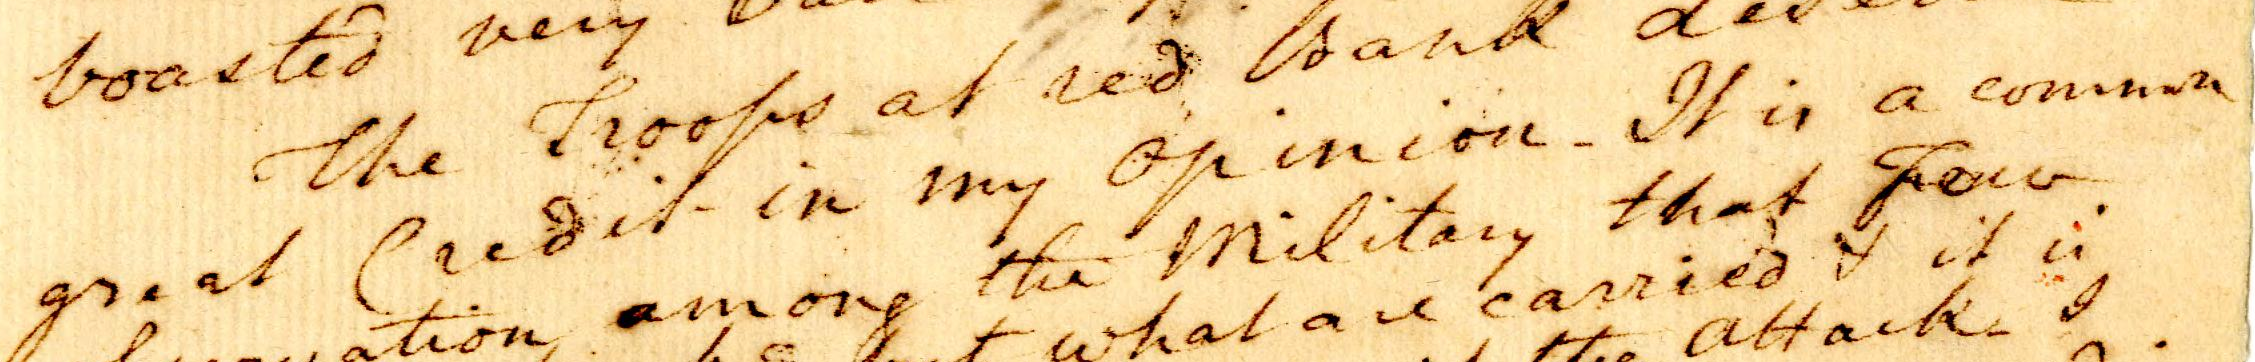great Credit in my opinion. It is a common
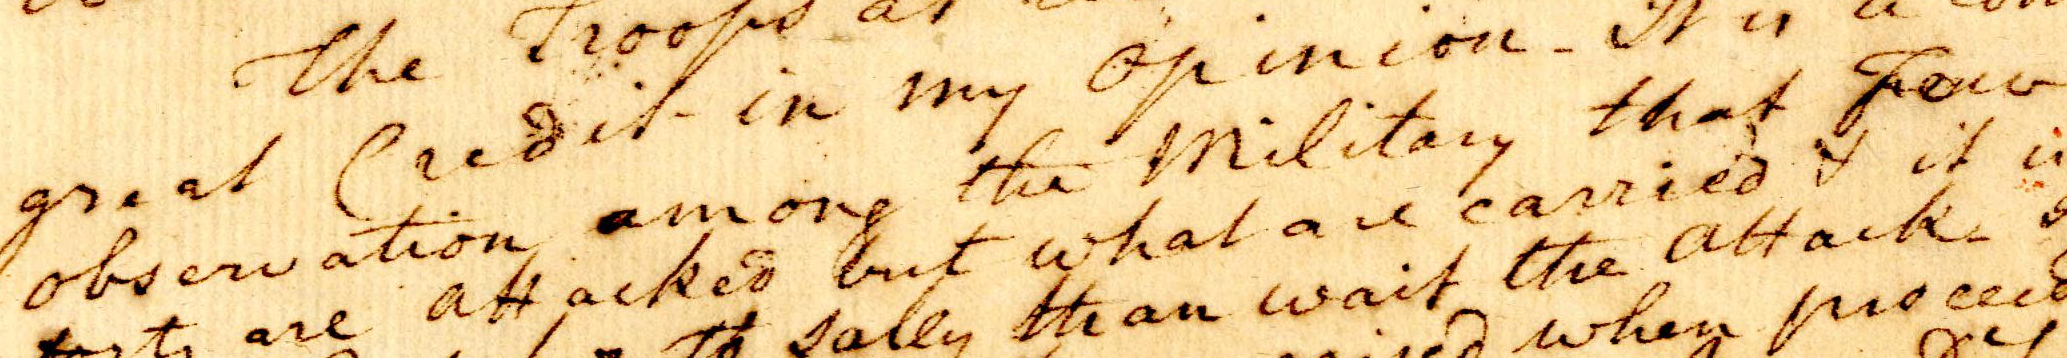observation, among the Military that few
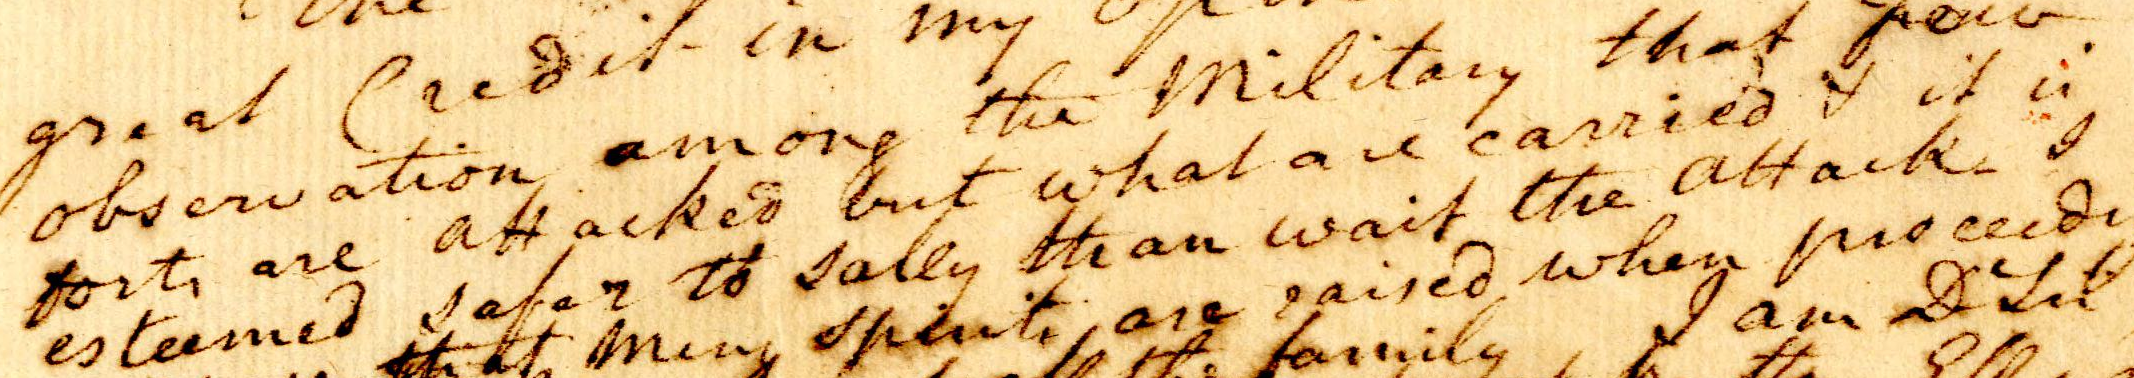forts are attacked but what are carried & it is
